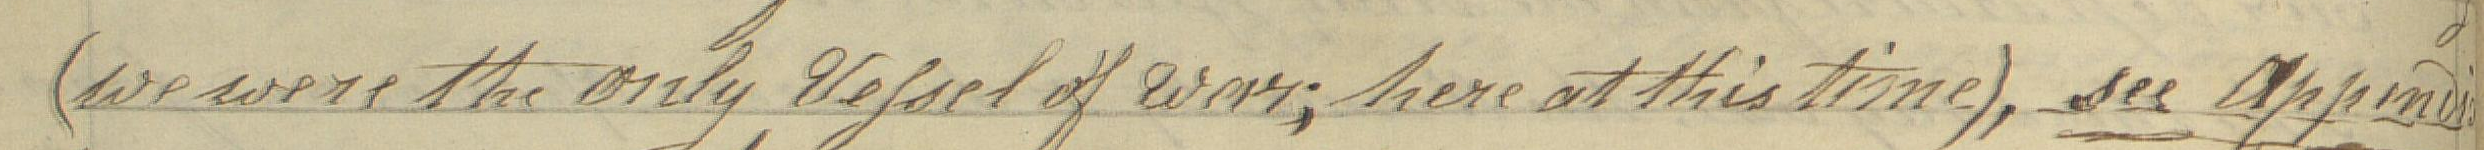(we were the only Vessel of war; here at this time), see Appendix
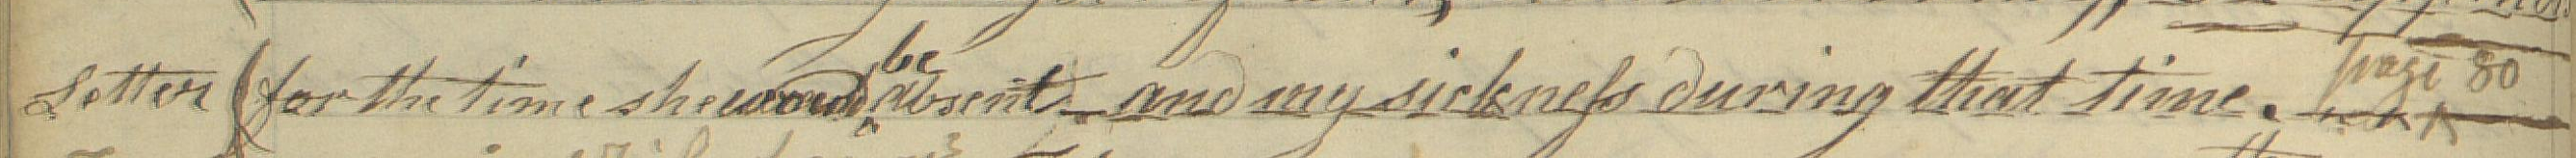Letter (for the time she would ^ absent and my sickness during that time. ^
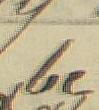be
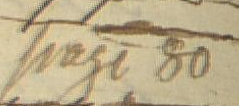page 80
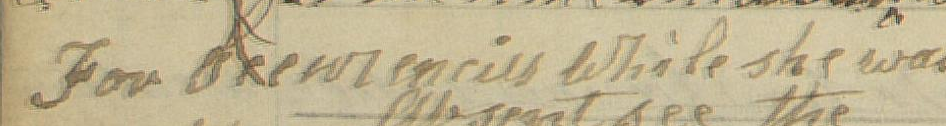For Brewrencies While she was
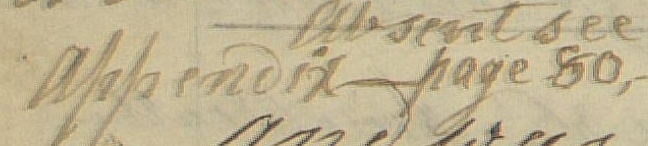Appendix page 80
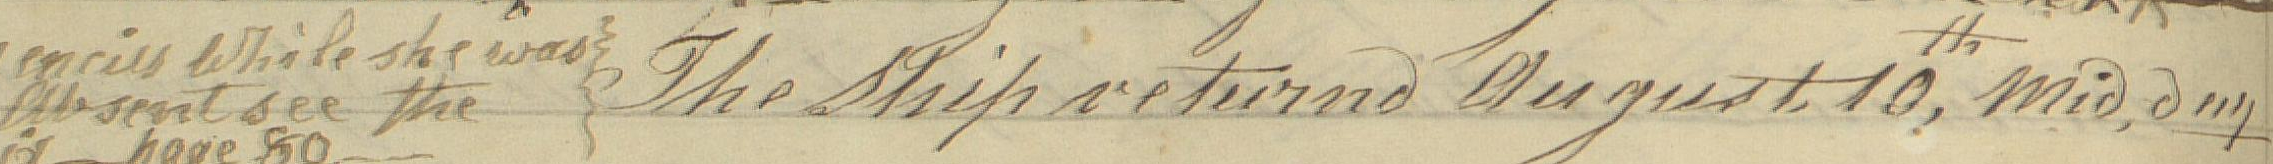Absent see the The Ship returnd August 10^th, Mid day
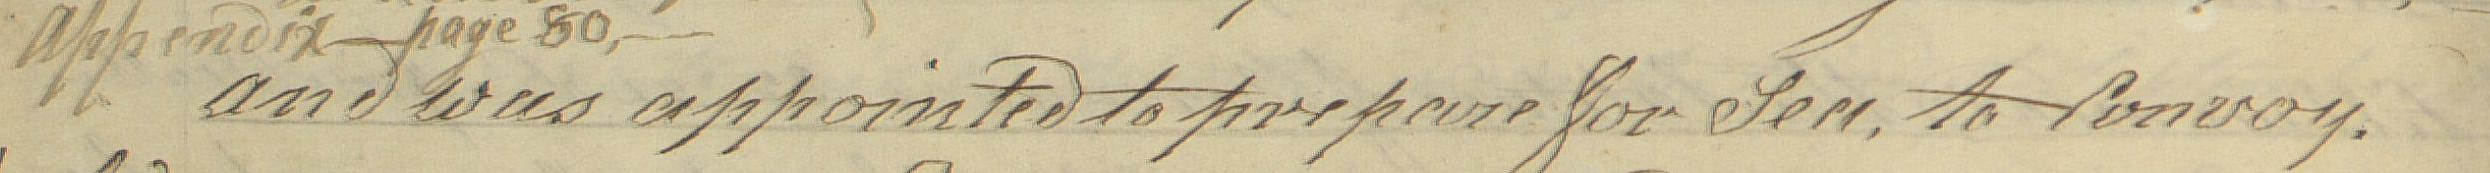and was appointed to prepare for Sea, to Convoy.
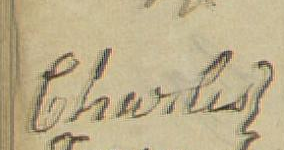Charles,
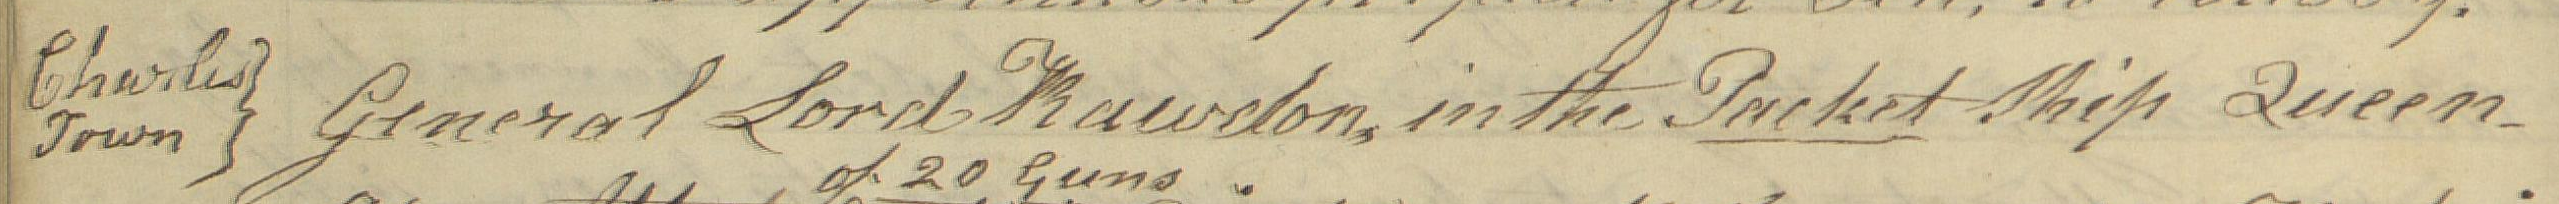Town General Lord Rawdon, in the Packet Ship Queen.
